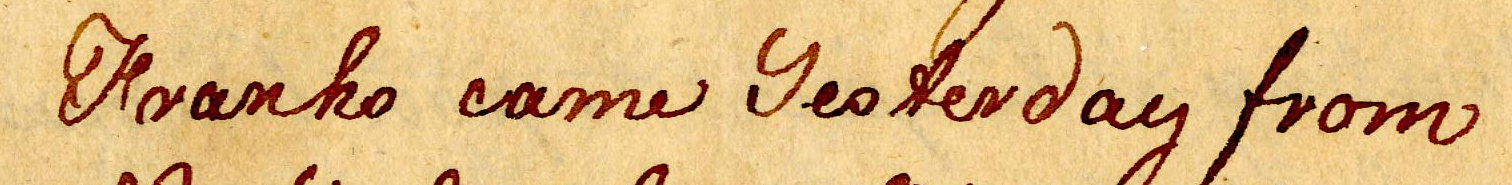Franks came Yesterday from
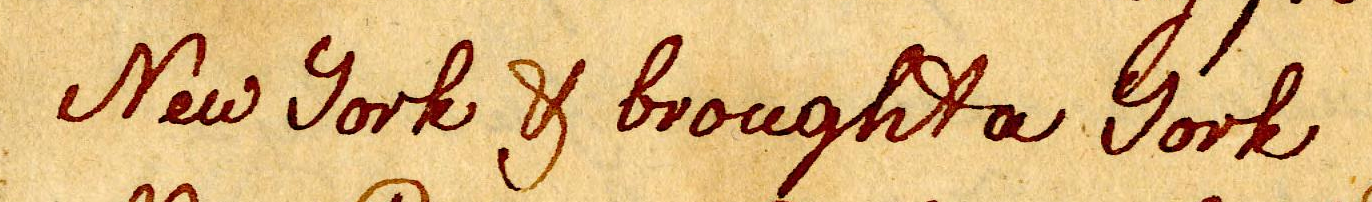New York & brought a York
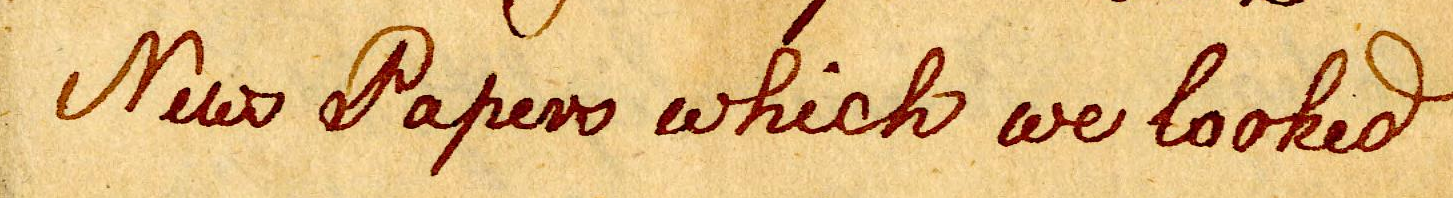News Papers which we looked
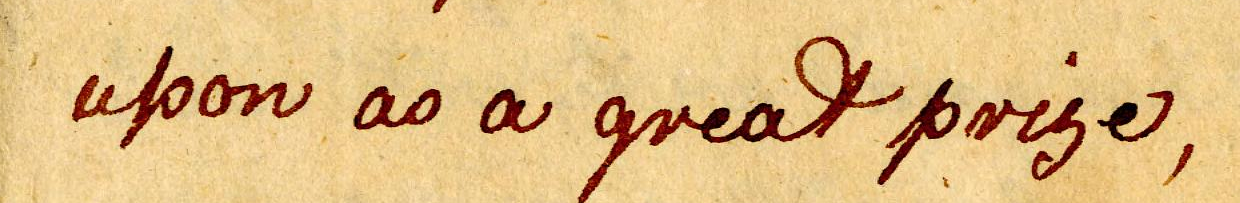upon as a great prize,
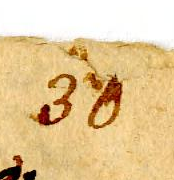30
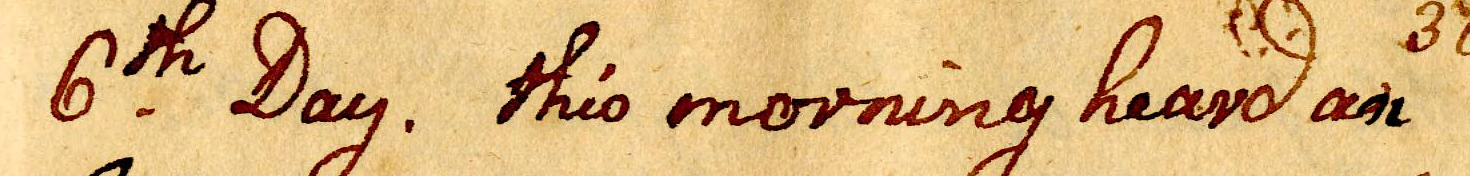6^th. Day. this morning heard an
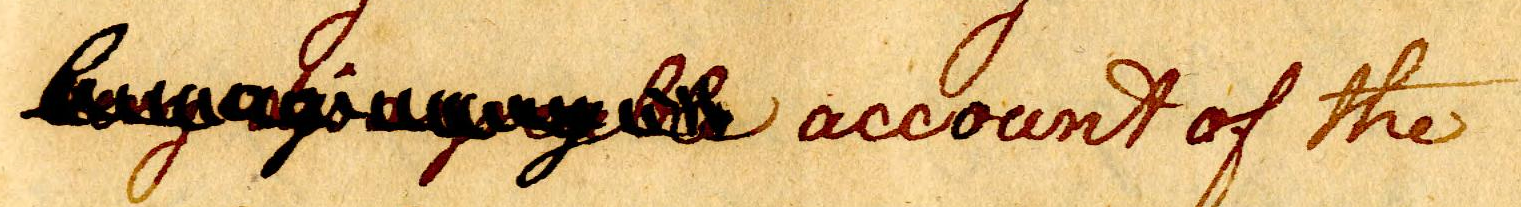[________________] account of the
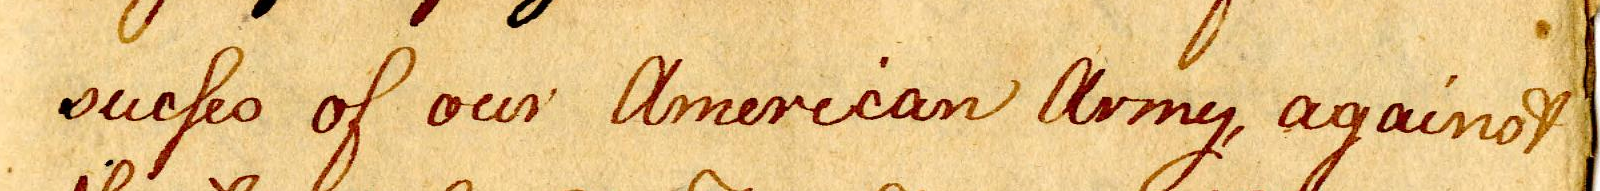sucses of our American Army, against
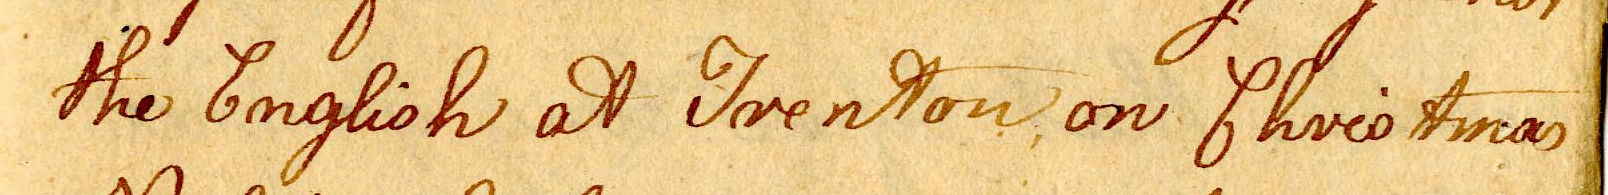the English at Trenton on Christmas
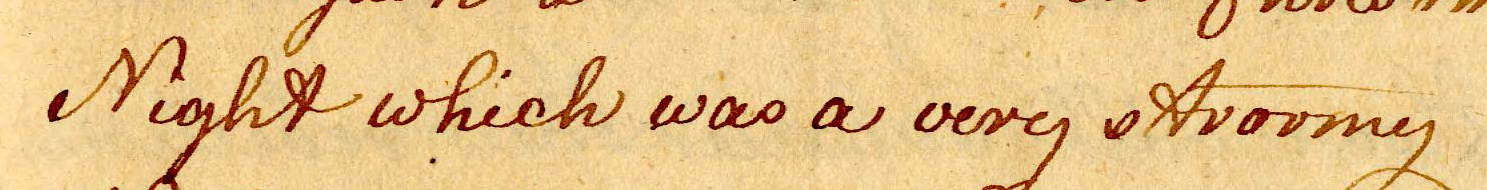Night which was a very strormy
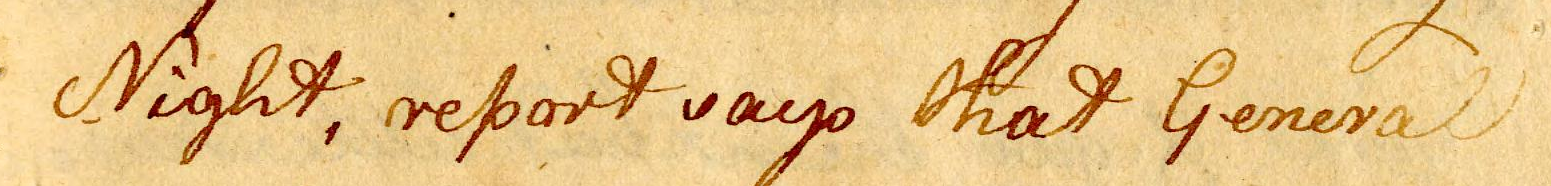Night, report says that General
